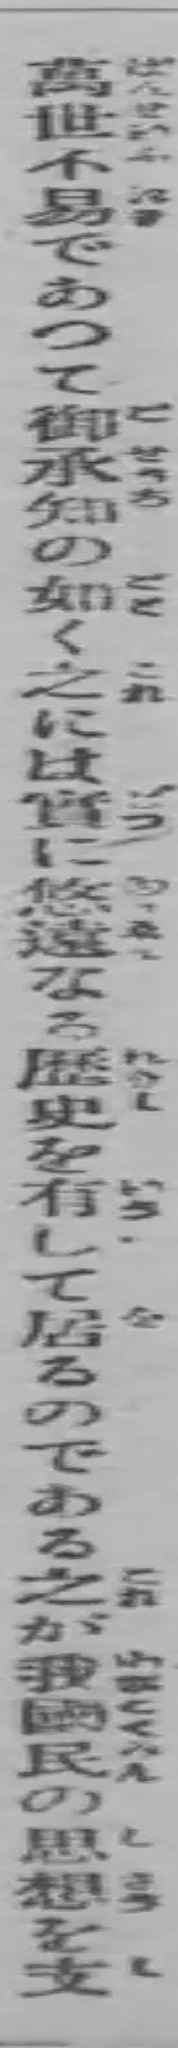万世不易であつて御承知の如く之には実に悠遠なる歴史を有して居るのである之が我国民の思想を支
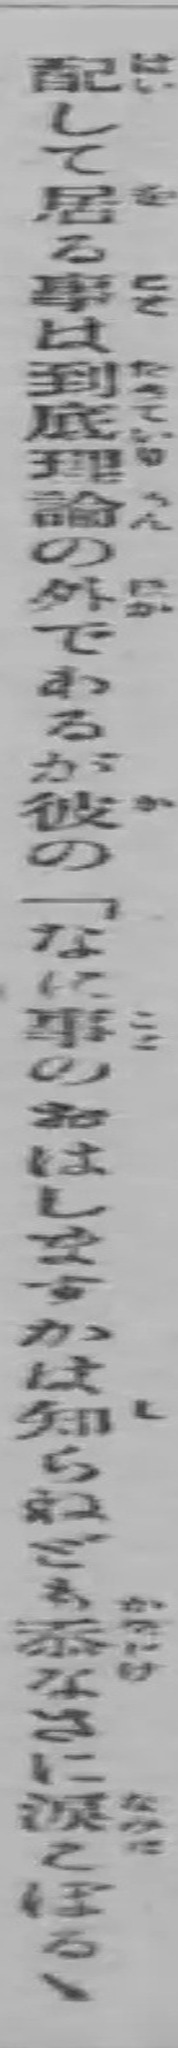配して居る事は到底理論の外であるが彼の「なに事のおはしますかは知らねども忝なさに涙こぼるゝ
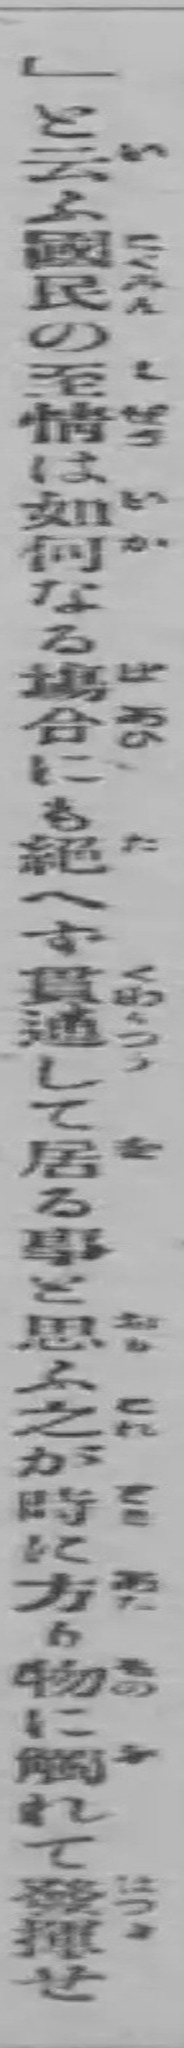」と云ふ国民の至情は如何なる場合にも絶へず貫通して居る事と思ふ之が時に方り物に触れて発揮せ
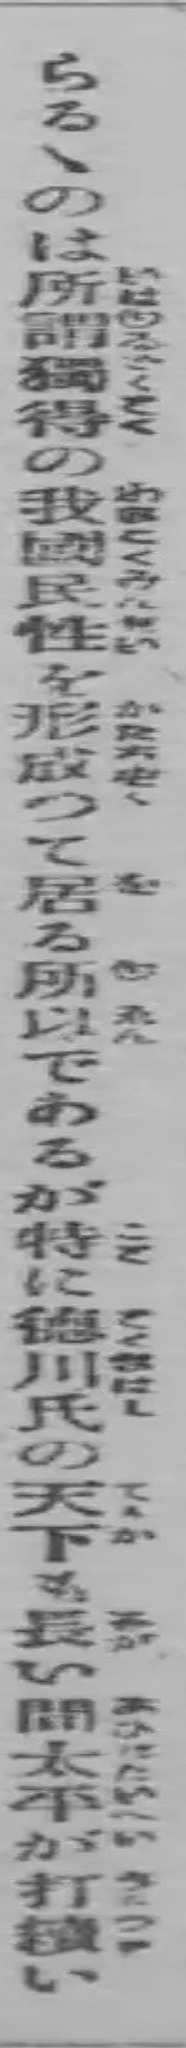らるゝのは所謂独得の我国民性を形成つて居る所以であるが特に徳川氏の天下も長い間太平が打続い
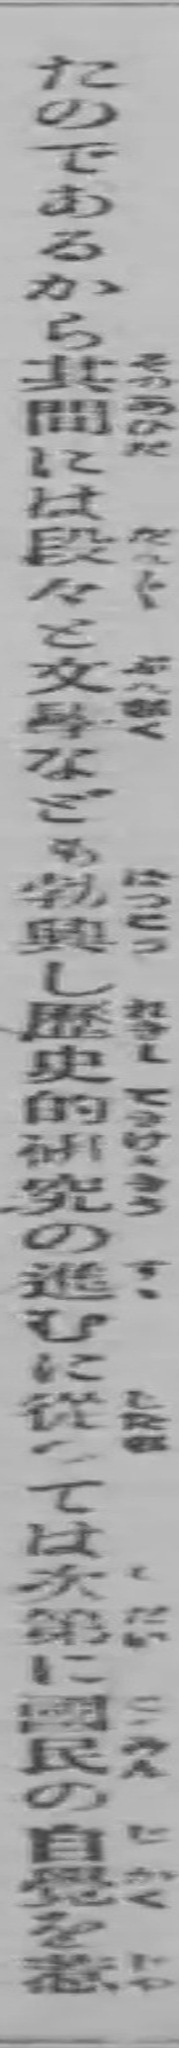たのであるから其間には段々と文学なども勃興し歴史的研究の進むに従つては次第に国民の自覚を惹
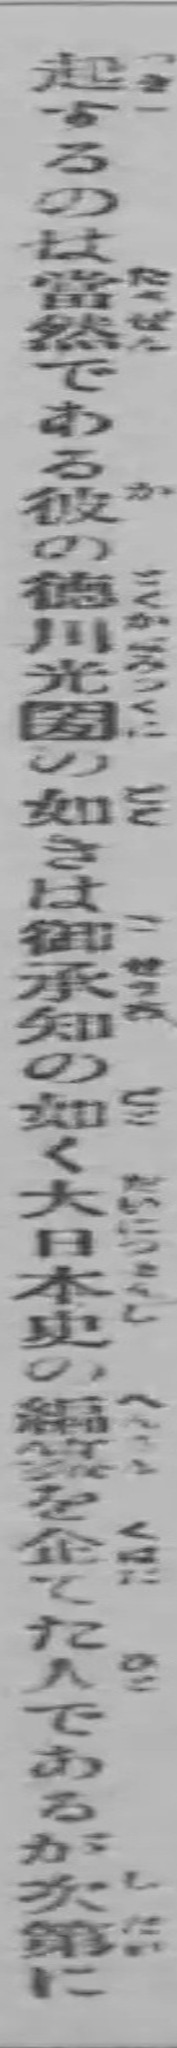起するのは当然である彼の徳川光圀の如きは御承知の如く大日本史の編纂を企てた人であるが次第に
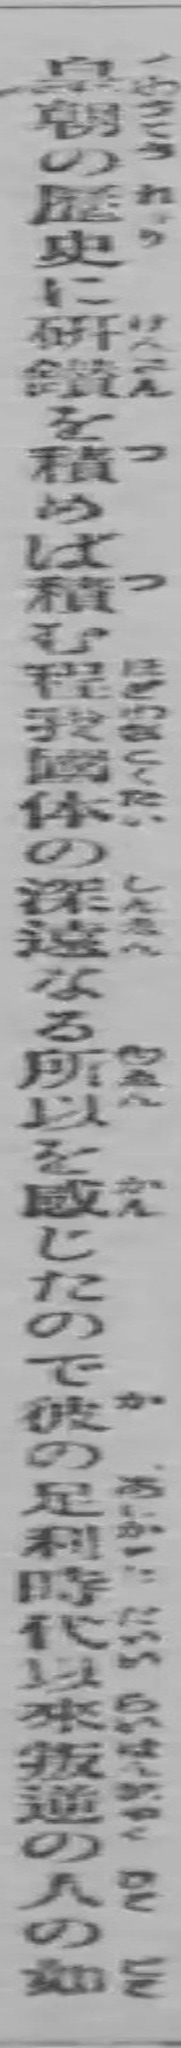皇朝の歴史に研鑽を積めば積む程我国体の深遠なる所以を感じたので彼の足利時代以来叛逆の人の如
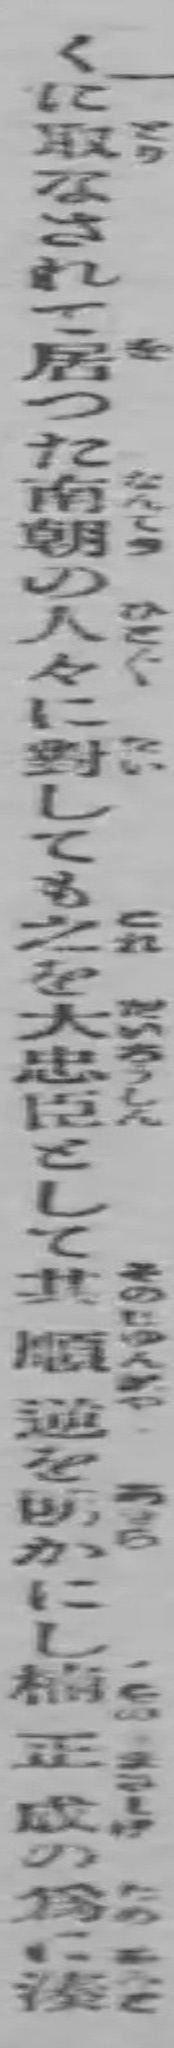くに取なされて居つた南朝の人々に対しても之を大忠臣として其順逆を明かにし楠正成の為に湊
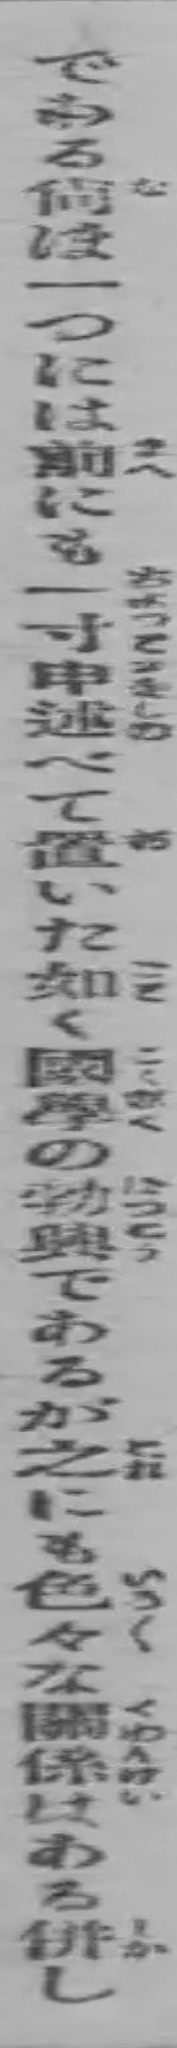である尚ほ一つには前にも一寸申述べて置いた如く国学の勃興であるが之にも色々な関係はある併し

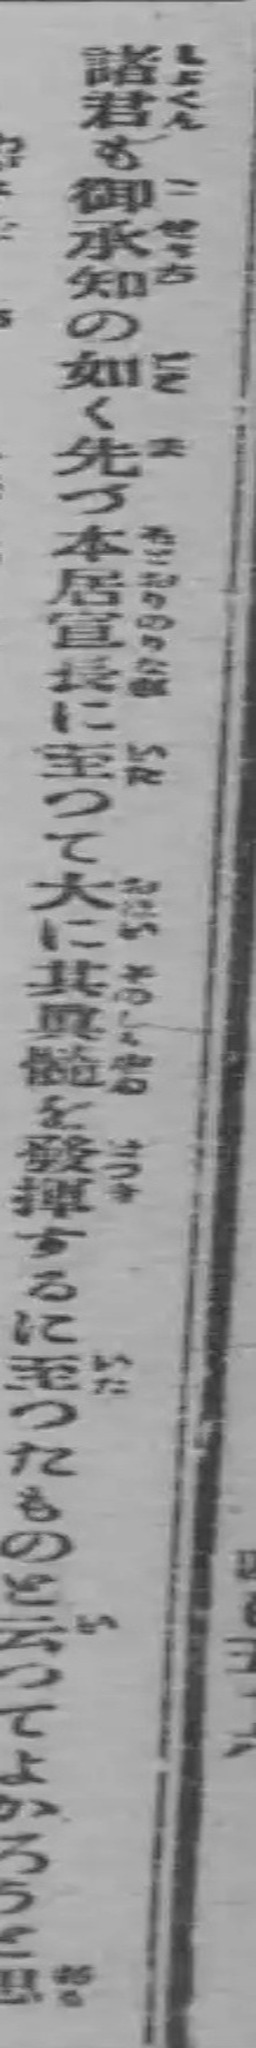諸君も御承知の如く先づ本居宣長に至つて大に其真髄を発揮するに至つたものと云つてよかろうと思
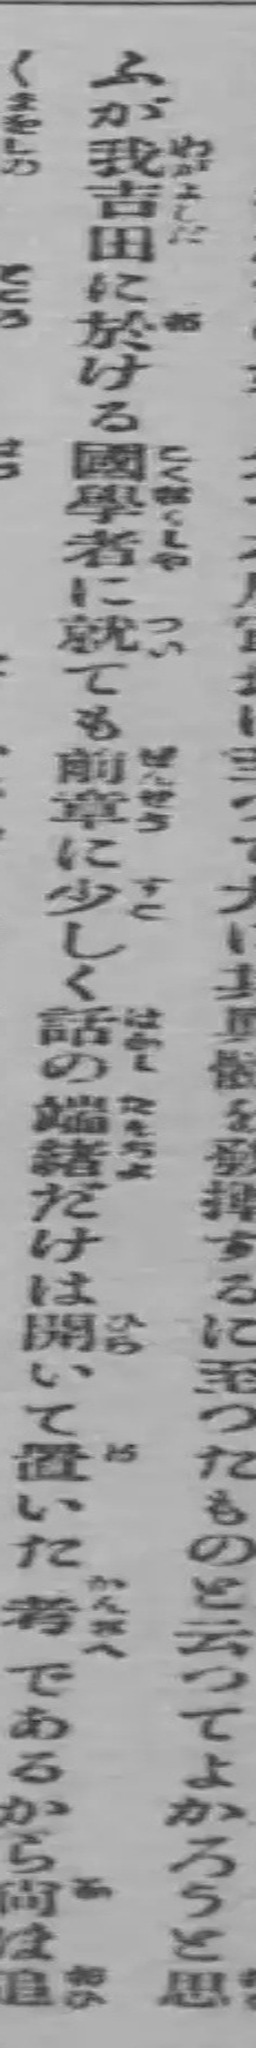ふが我吉田に於ける国学者に就ても前章に少しく話の端緒だけは開いて置いた考であるから尚ほ追
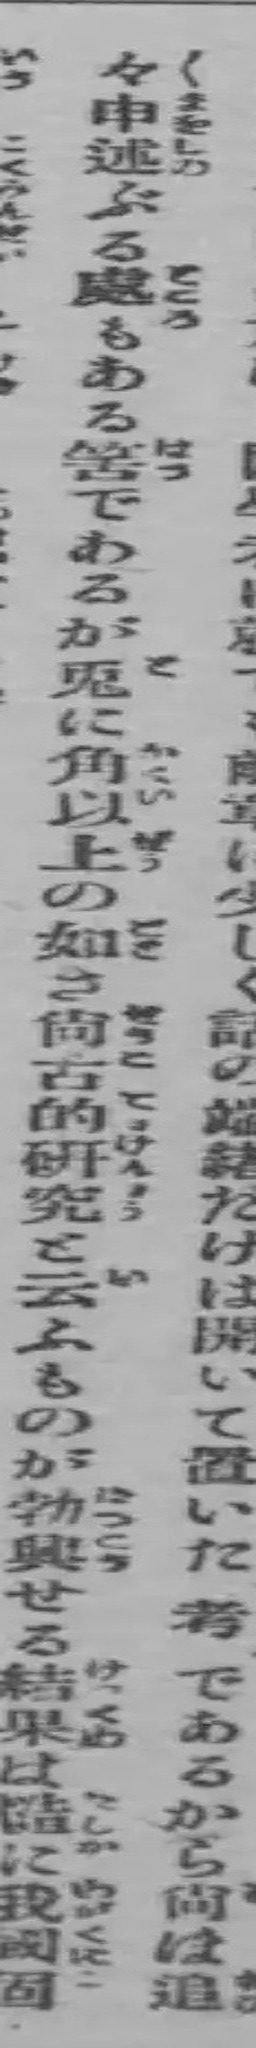追申述ぶる処もある筈であるが兎に角以上の如き尚古的研究と云ふものが勃興せる結果は慥に我国固
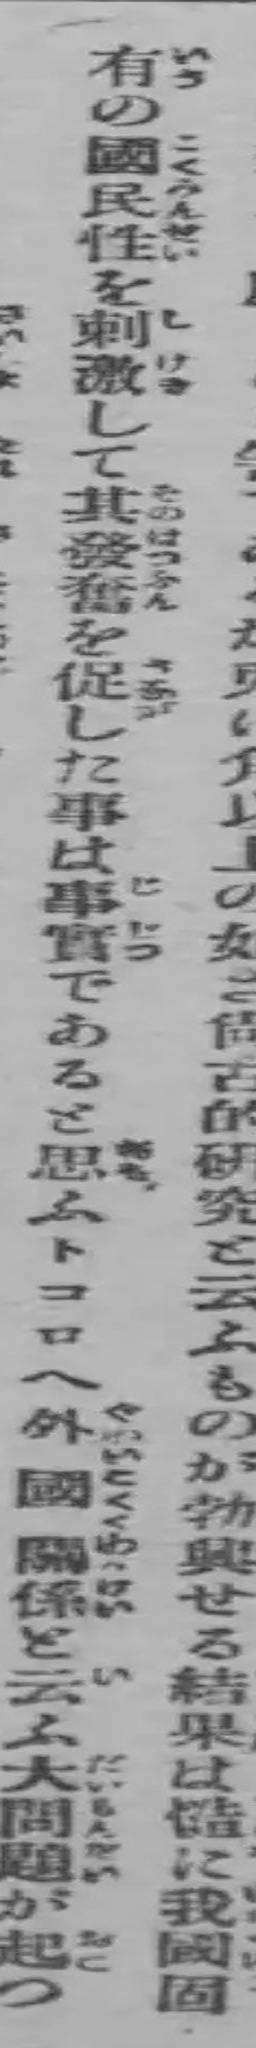有の国民性を刺激して其発奮を促した事は事実であると思ふトコロへ外国関係と云ふ大問題が起つ
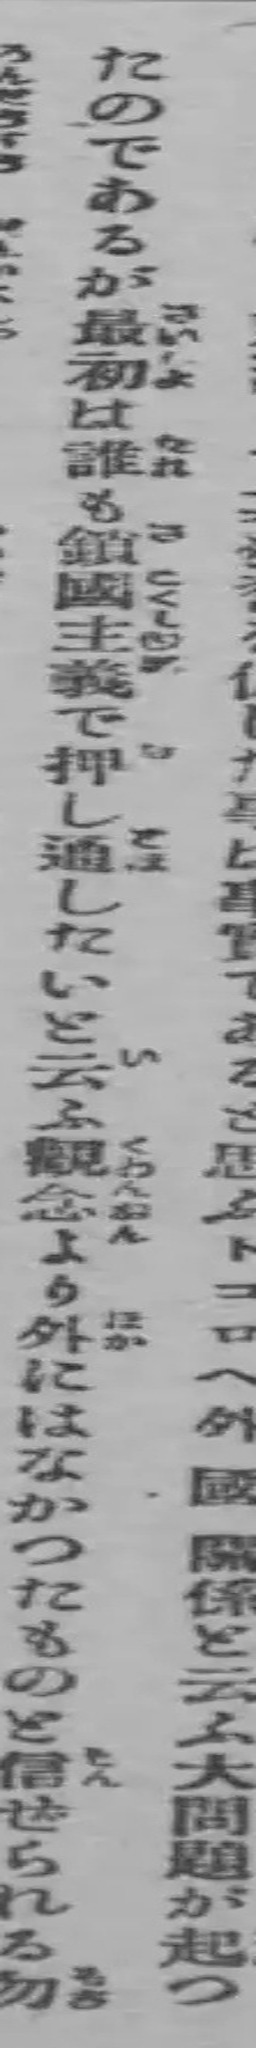たのであるが最初は誰も鎖国主義で押し通したいと云ふ観念より外にはなかつたものと信ぜられる勿
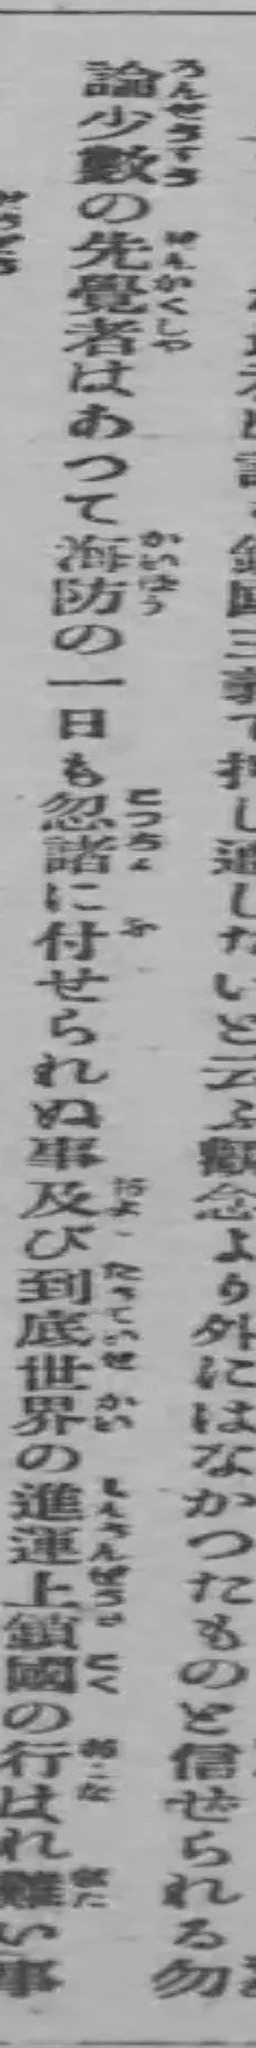論少数の先覚者はあつて海防の一日も忽諸に付せられぬ事及び到底世界の進運上鎖国の行はれ難い事
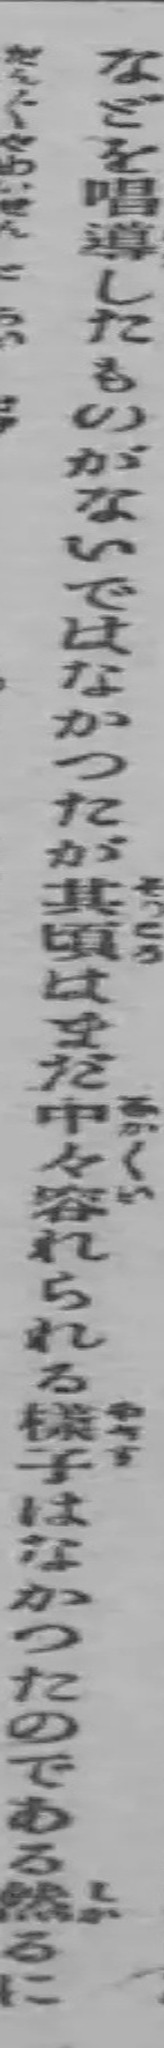などを唱導したものがないではなかつたが其頃はまだ中々容れられる様子はなかつたのである然るに
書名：豊橋市史談
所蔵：国立国会図書館 National Diet Library, JAPAN
